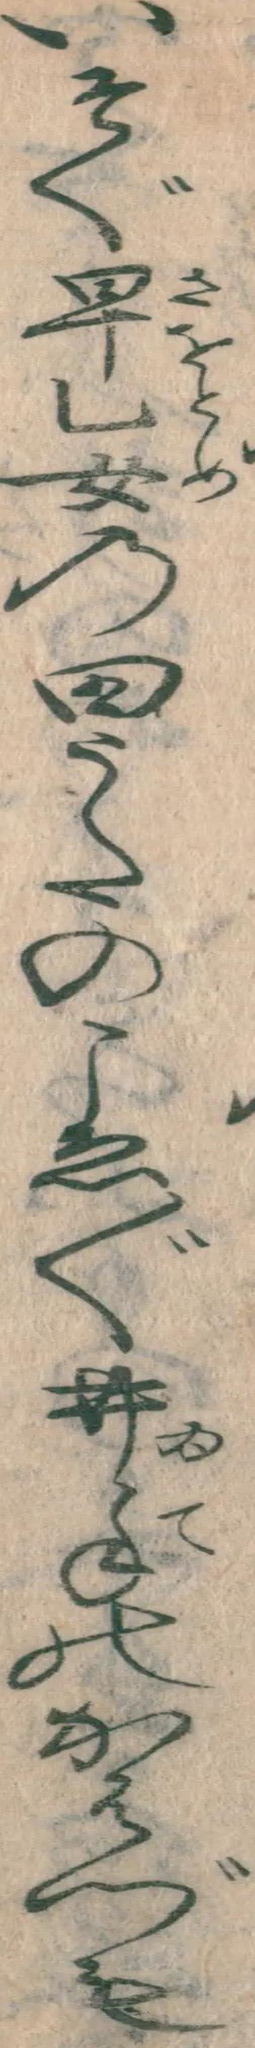いそぐ早乚女の田うたのこゑ〴〵井手のかはづも
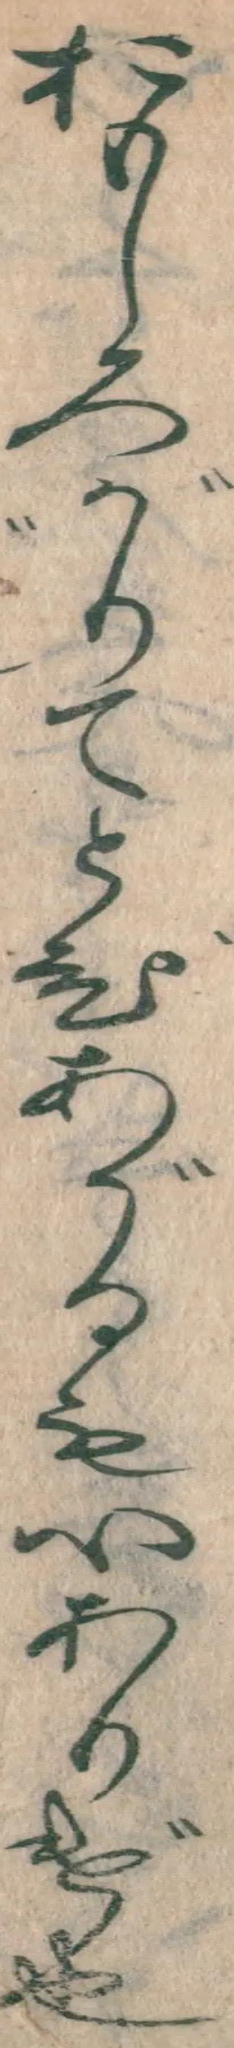おもしろがりてとびあがるも心ありげ也
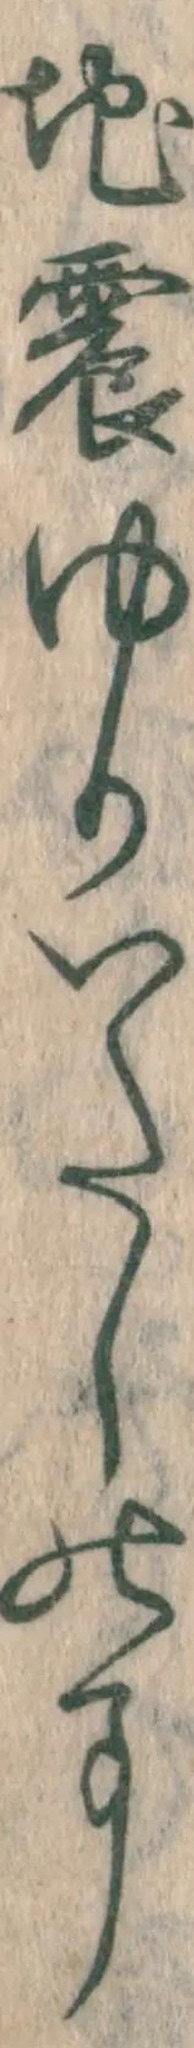一地震ゆりいだしの事
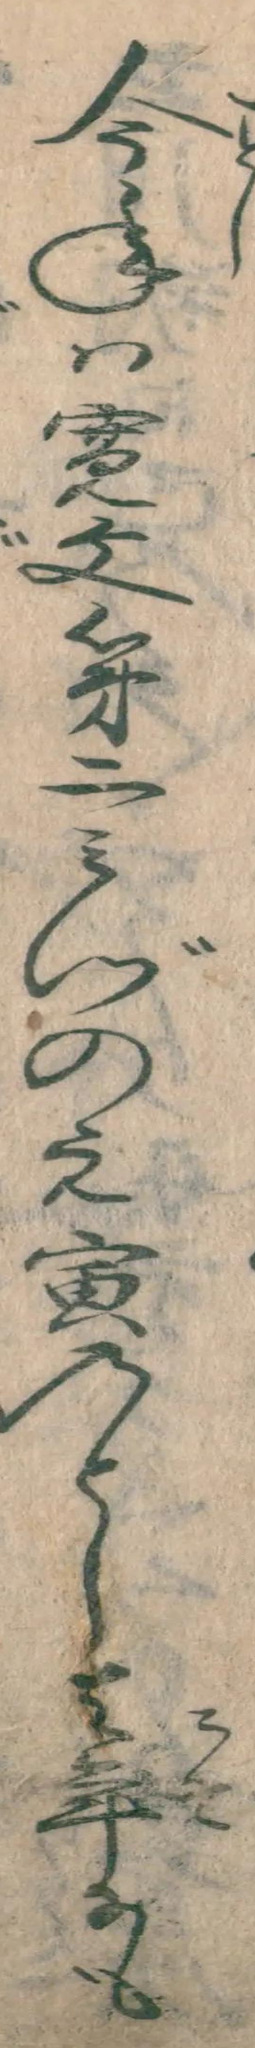今年は寛文第二みづのえ寅のとし去年にも
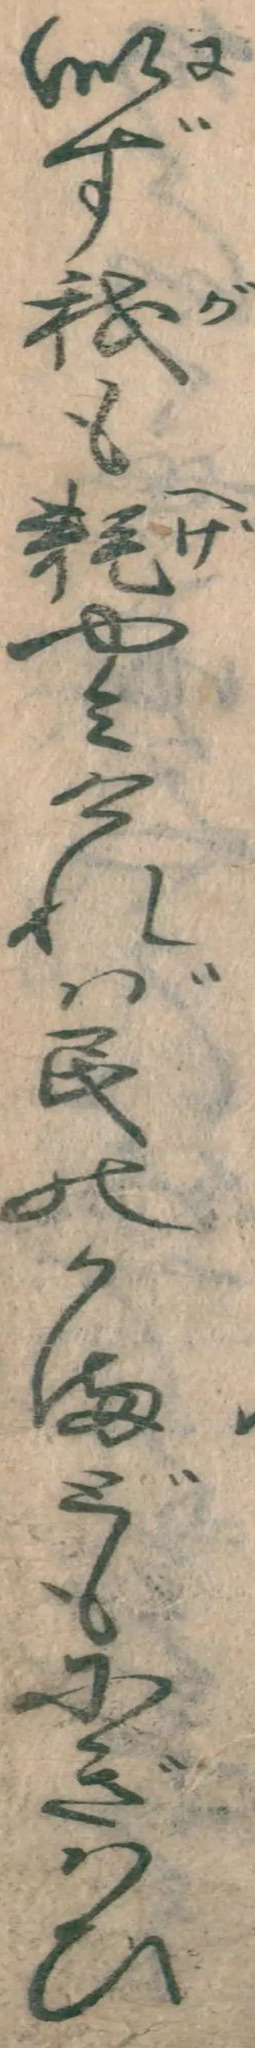似ず我も耗やみければ民のかまどもにぎはひ

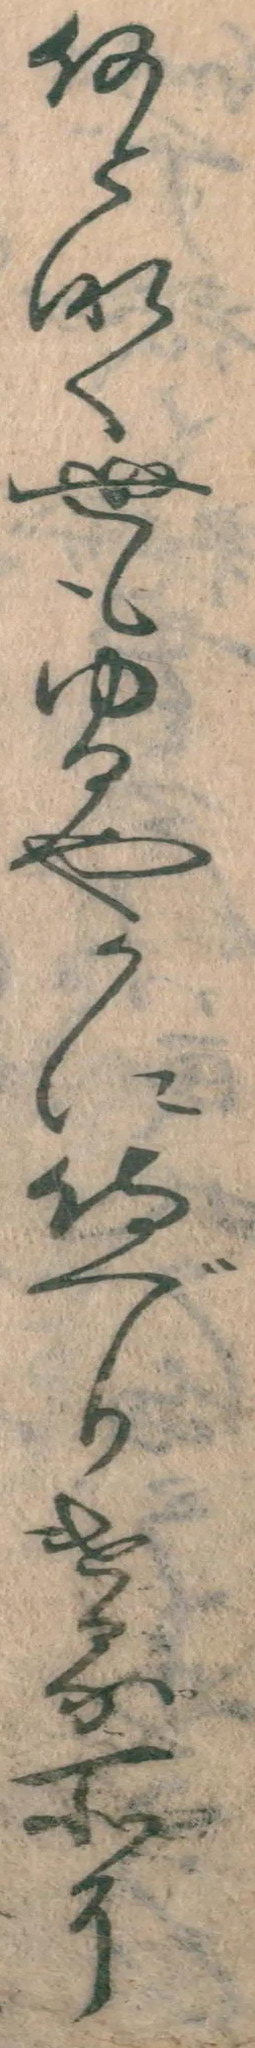何となく世もゆるやかに侍べりける所に
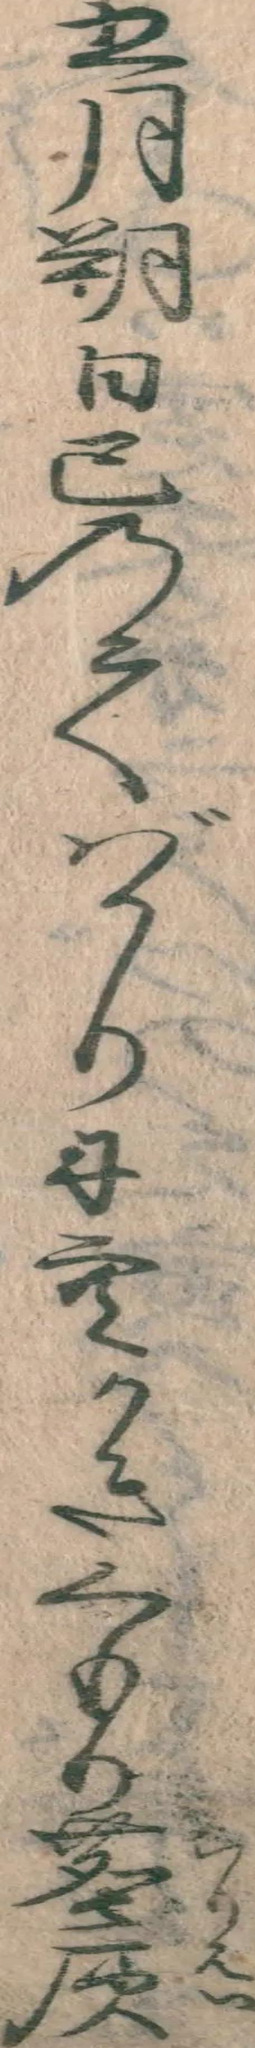五月朔日巳のこくばかりに空かきくもり塵灰
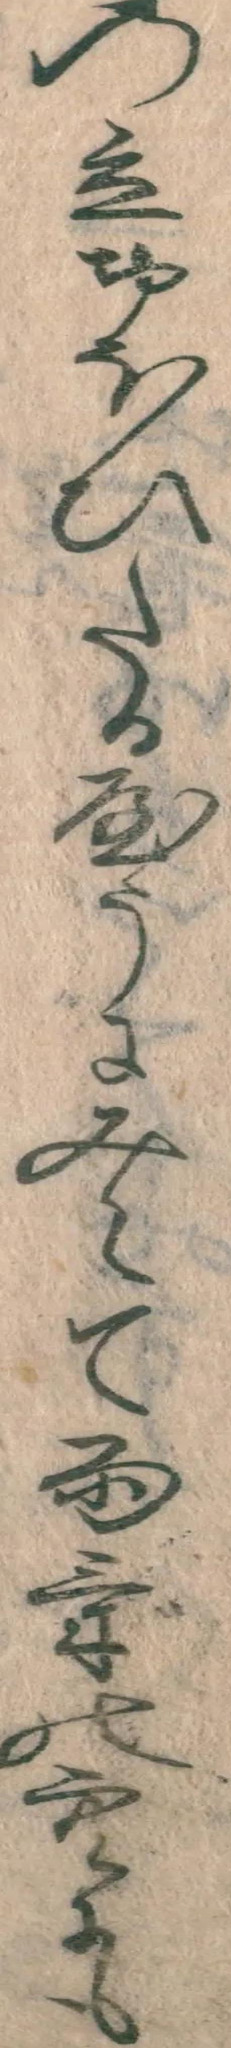の立おほひたるやうにみえて雨げの空にも
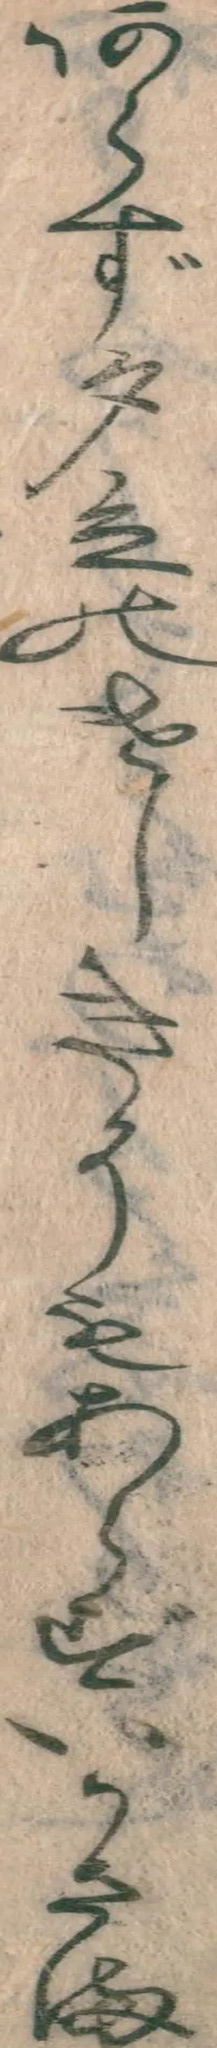あらず夕立のけしきにもあらずいかさま
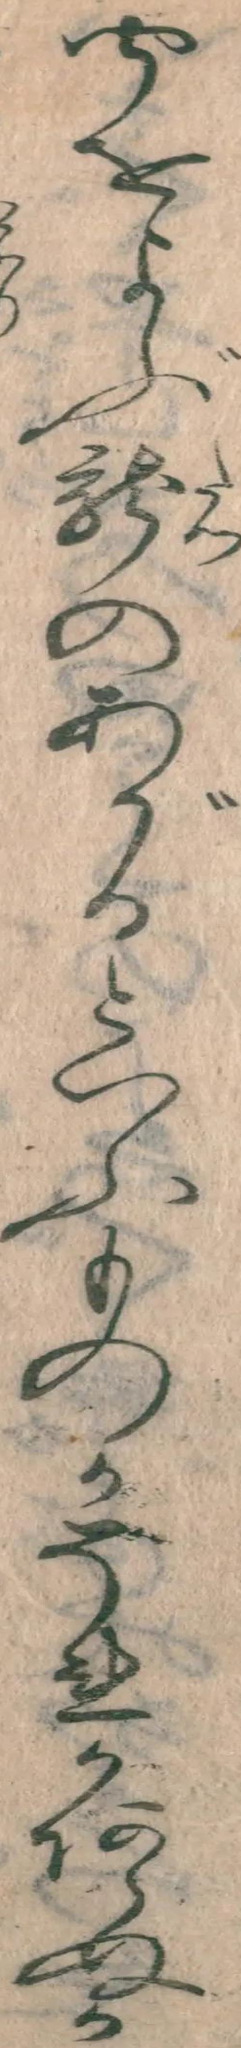聞をよぶ龍のあがるといふものかそれかあらぬか
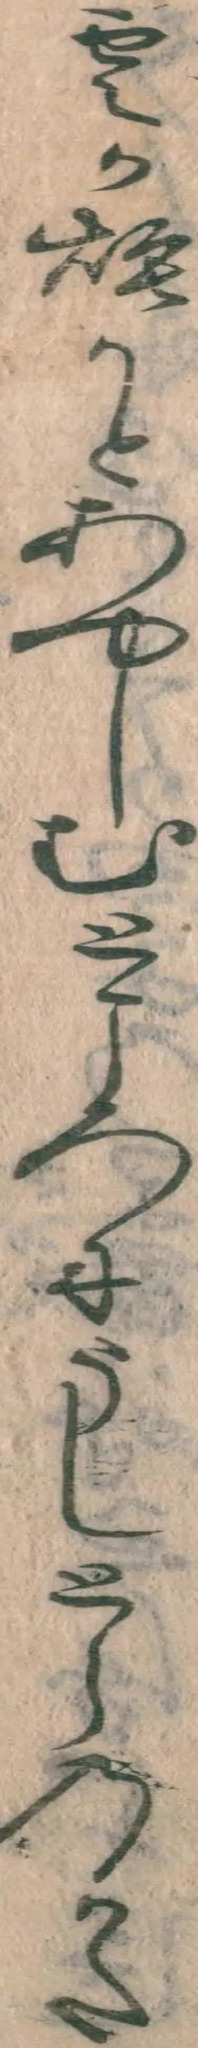雲か煙かとあやしむところにうしとらのかた
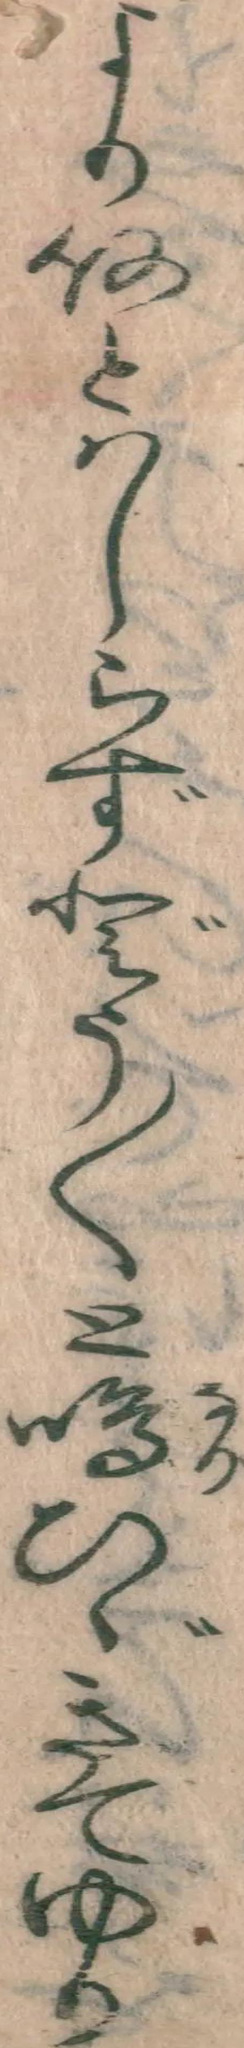より何とはしらずどう〳〵と鳴ひゞきてゆり
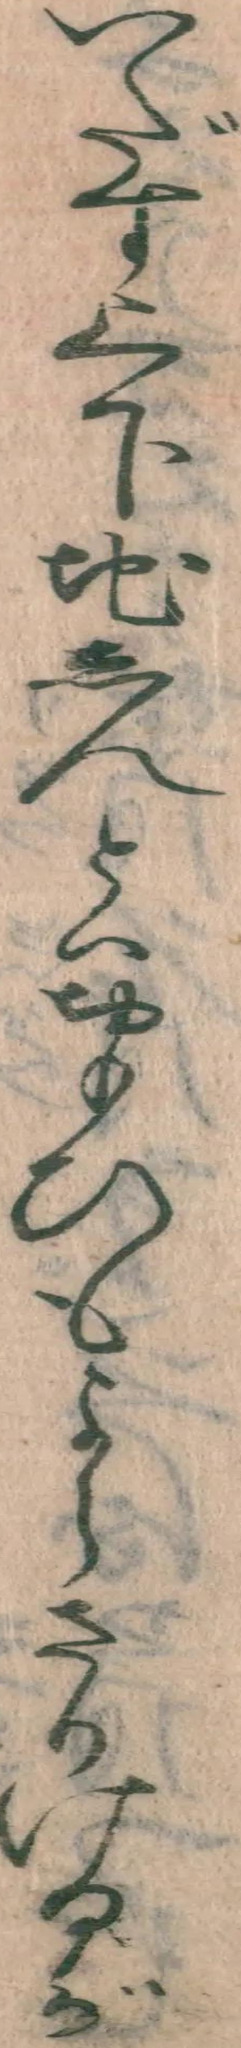いだす上下地しんとはおもひもよらさりけるが
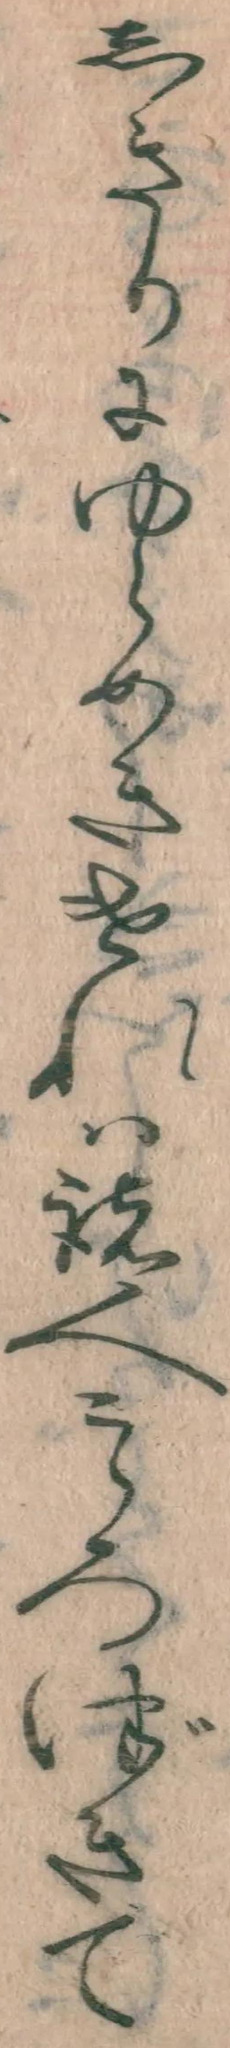しきりにゆらめきけれは諸人こゝろづきて
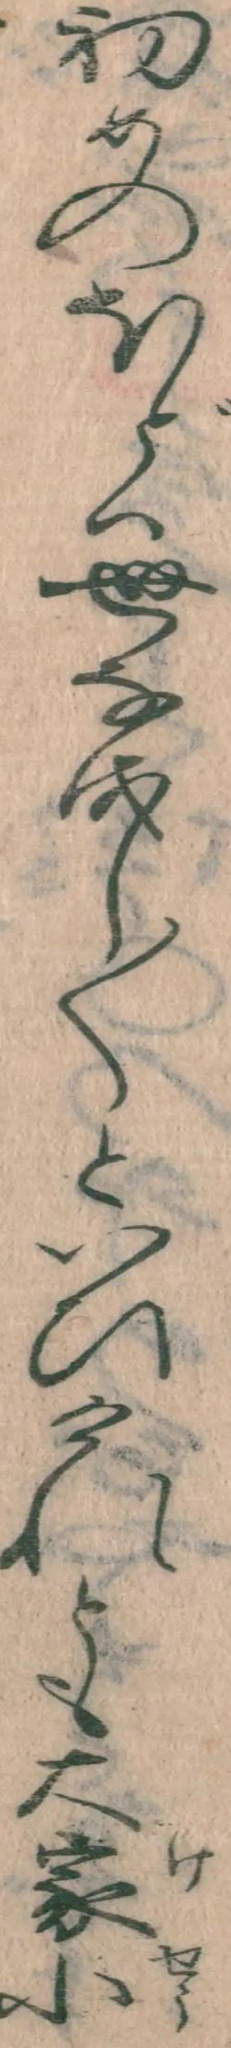初めのほどは世なをし〳〵といひけれとも大家小
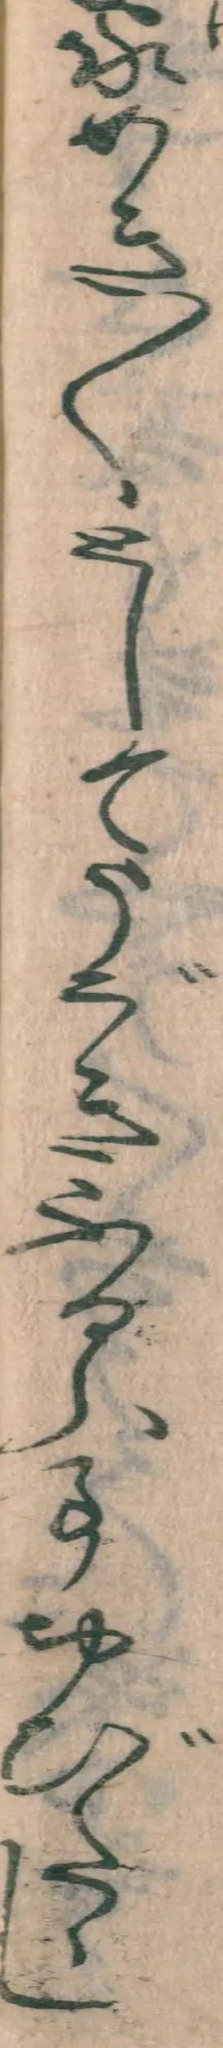家めき〳〵としてうごきふるふ事おびたゝし
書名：艱難目異志. 上,下
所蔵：国立国会図書館 National Diet Library, JAPAN
